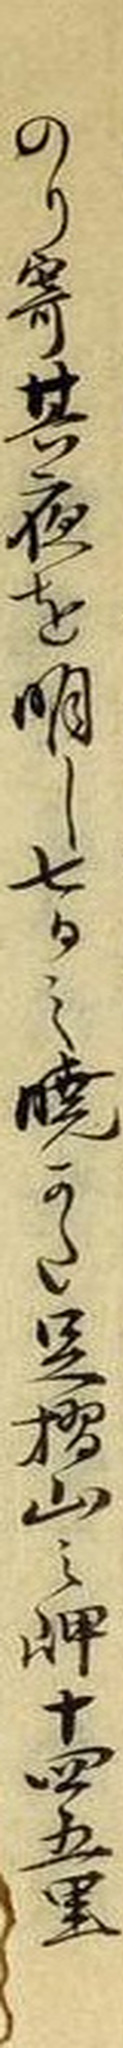のり寄其夜を明し七日之暁かた足摺山之岬十四五里
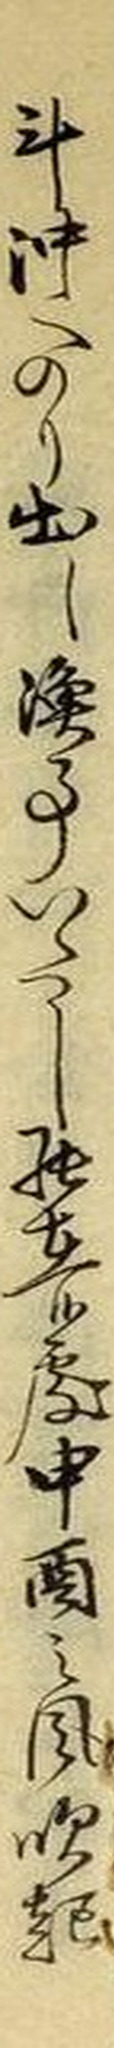計沖へのり出し漁事いたし罷在候處申酉之風吹起
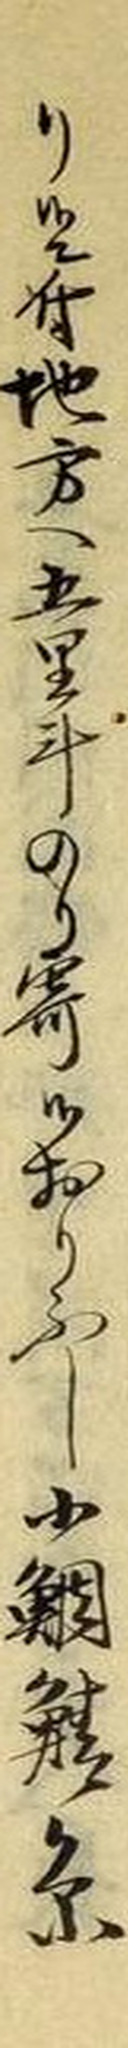り候二付地方へ五里計のり寄候おりふし小鯛鯖糸
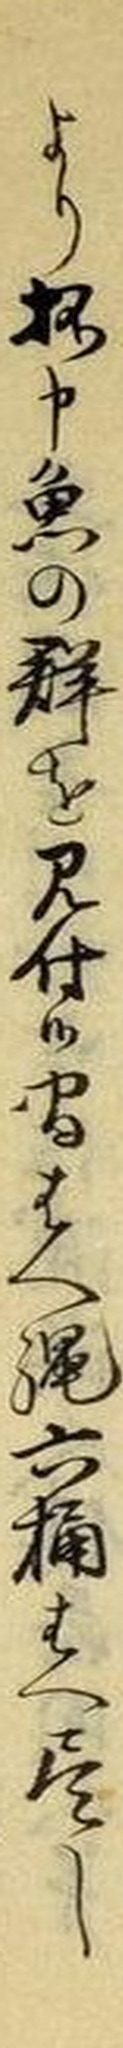より抔申魚の群を見付候間はへ縄六桶はへ尽し
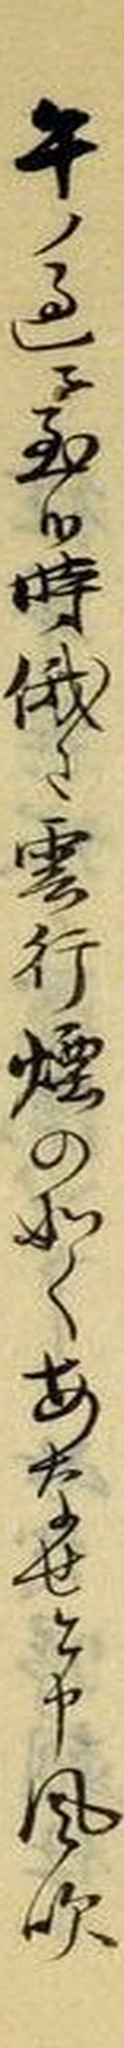午ノ過ニ至候時俄に雲行煙の如くあなせと申風吹
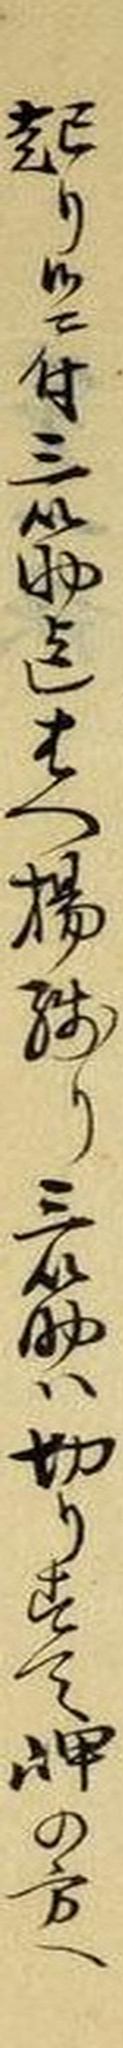起り候ニ付三筋迄はへ揚残り三筋ハ切りすて岬の方へ
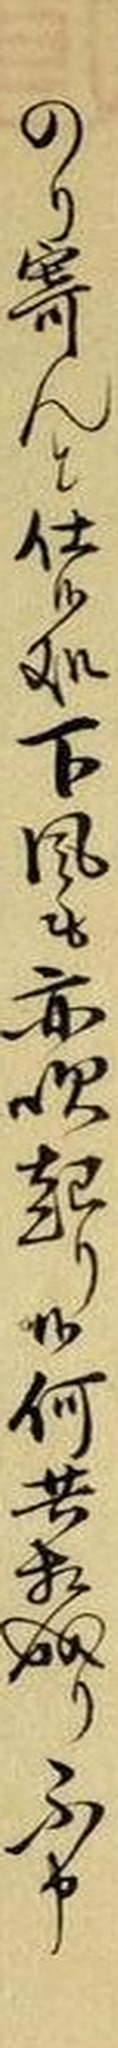のり寄んと仕候処下風も亦吹起り候何共相成り不申
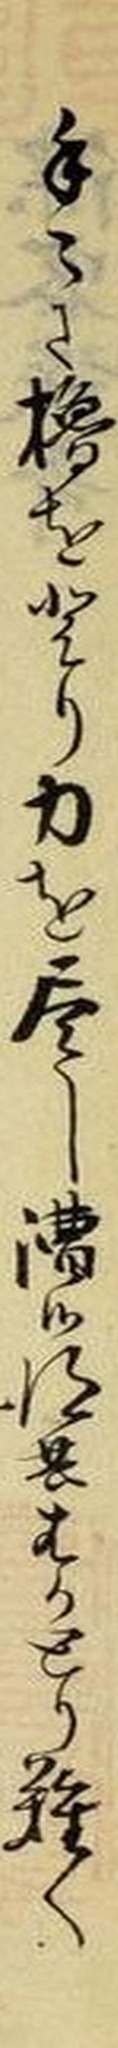手〻に櫓をとり力を尽し漕候得共はかとり難く
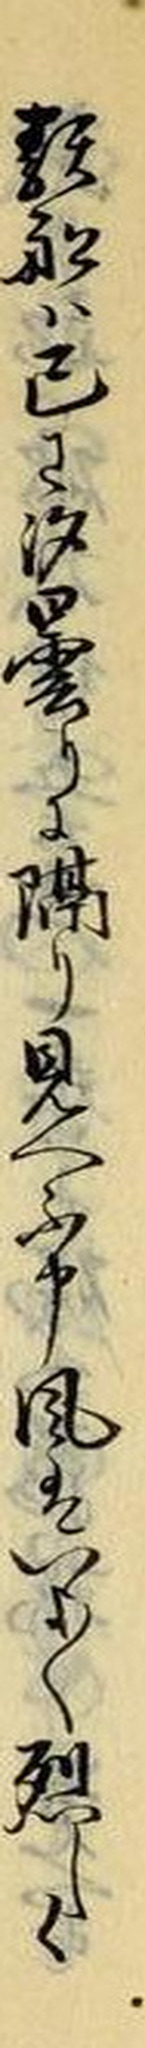類船ハ已に汐曇りに隔り見へ不申風はいよ〳〵烈しく
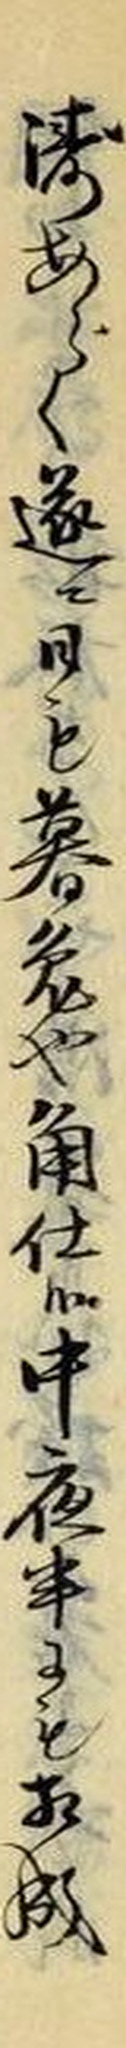涛あらく遂に日も暮兎や角仕候中夜半にも相成
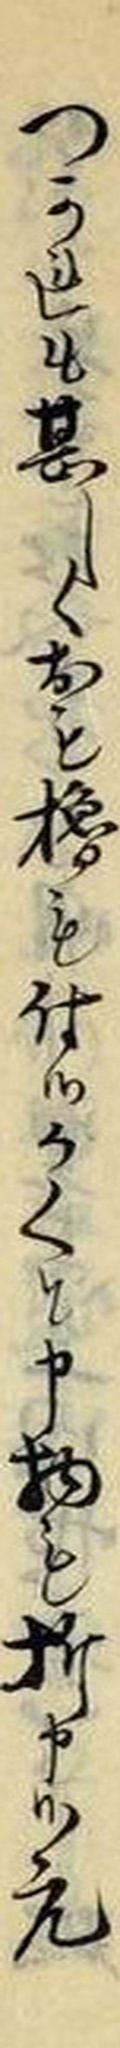つかれも甚しくおも櫓も付候かくと申物も折申候元
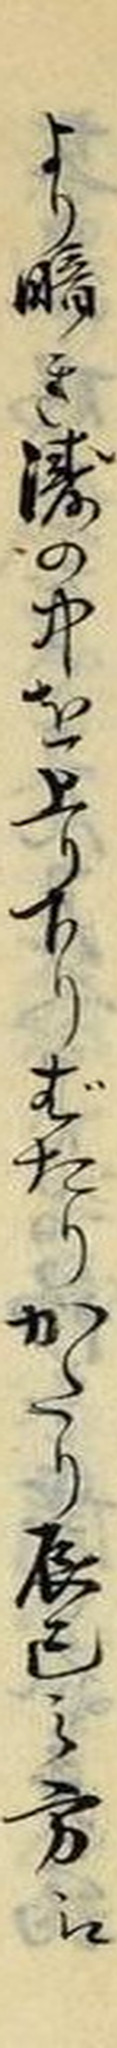より暗き涛の中を上り下りばたりかたり辰巳之方江
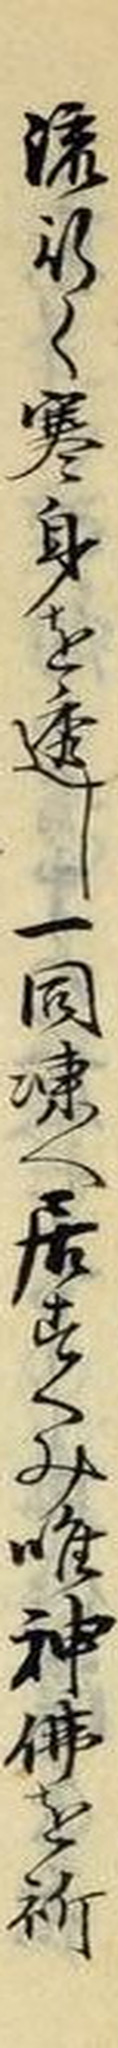流行く寒身を透し一同凍へ居すくみ唯神佛を祈
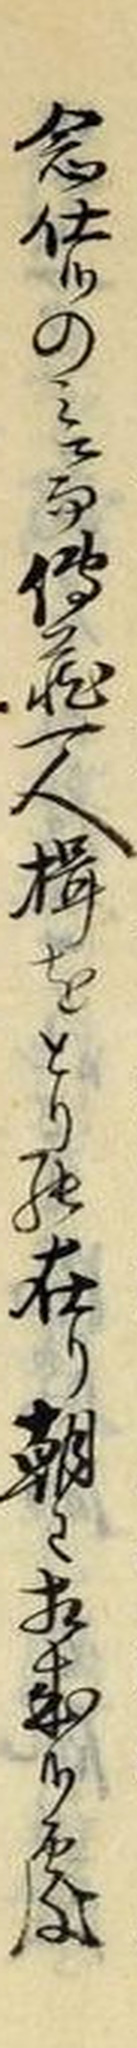念仕候のミニ而傳蔵一人楫をとり罷在り朝に相成候處
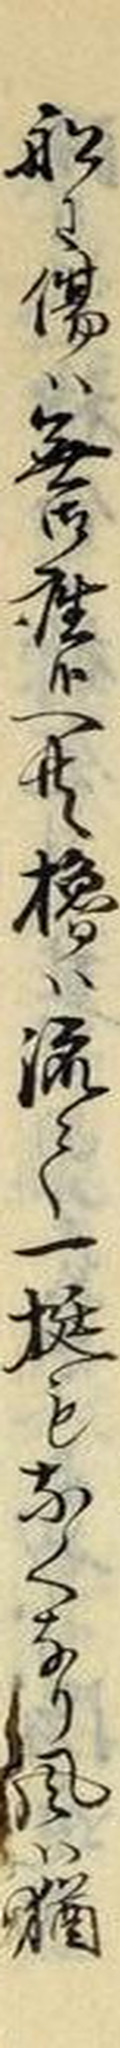船に傷ハ無御座候へ共櫓ハ流て一挺もなくり風ハ猶
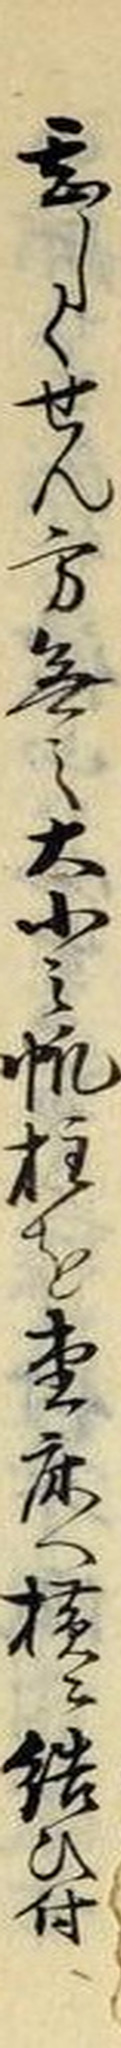甚しくせん方無之大小之帆柱を束床へ横ニ結ひ付
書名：漂客談奇（備考雑録写8）
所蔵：福井県文書館 Fukui Prefectural Archives
